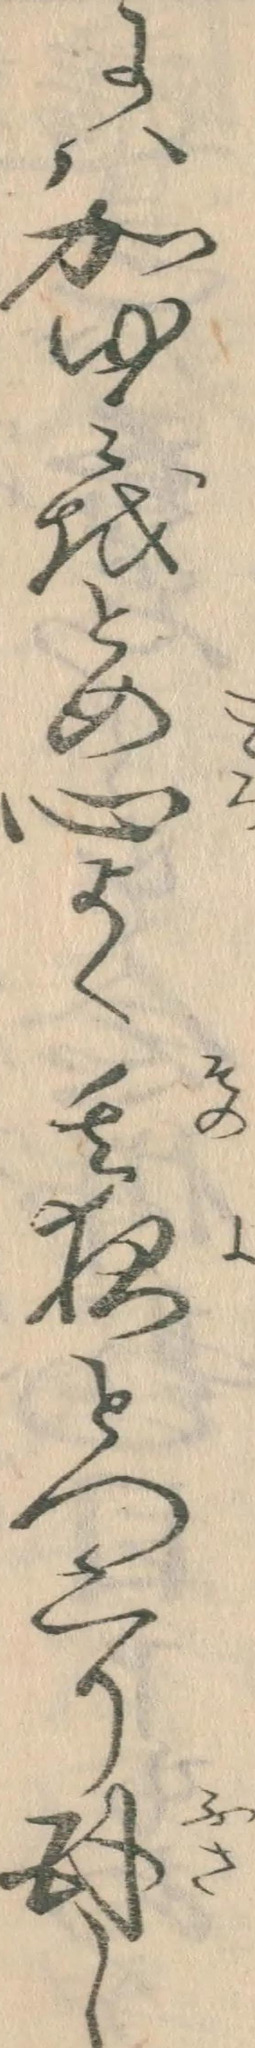にはかゆみをとめ心よく其夜とつくり臥し
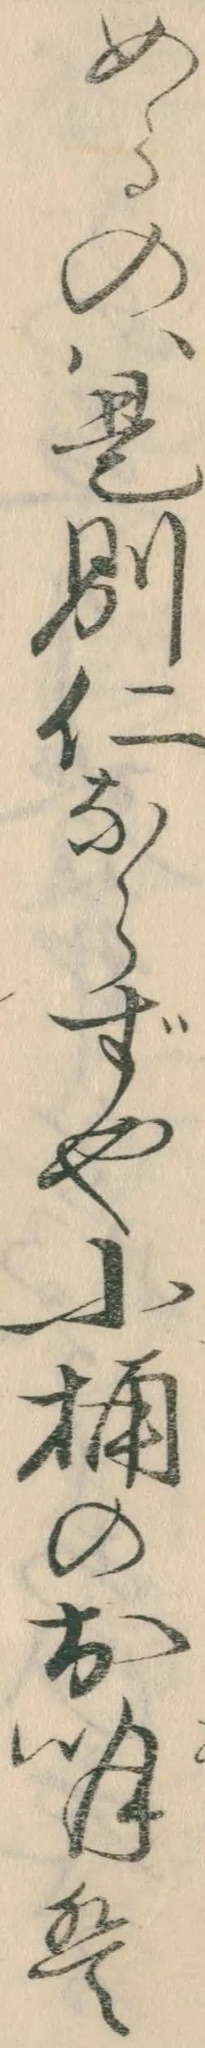めるのは是則仁ならずや小桶のお明は
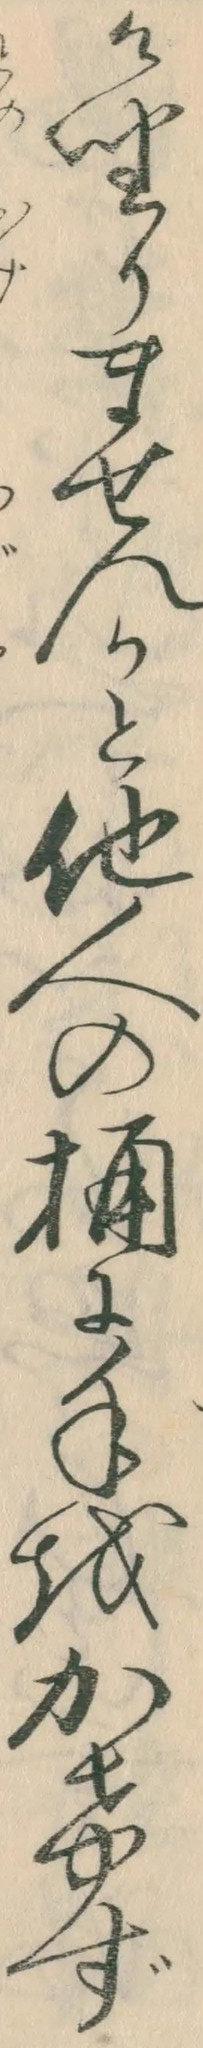御坐りませんかと他人の桶に手をかけず
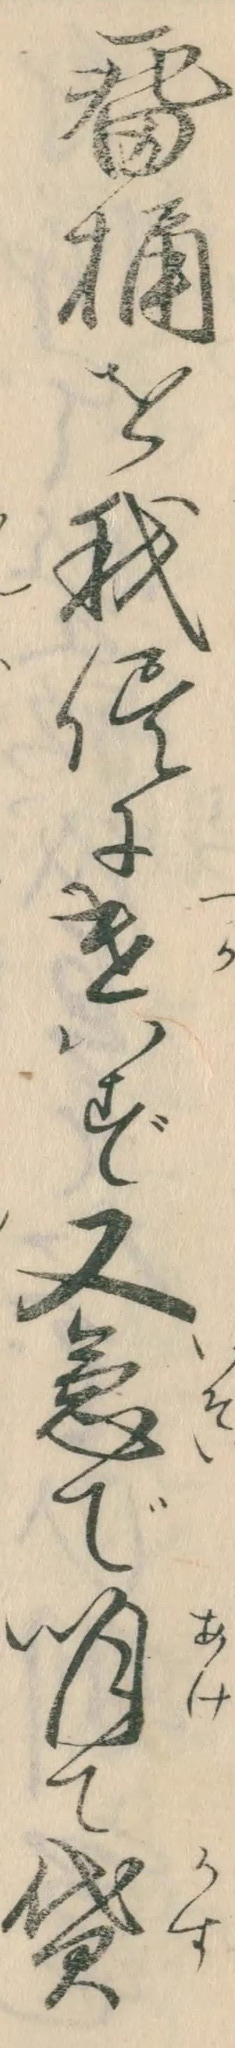留桶を我儘に遣はず又急で明て貸
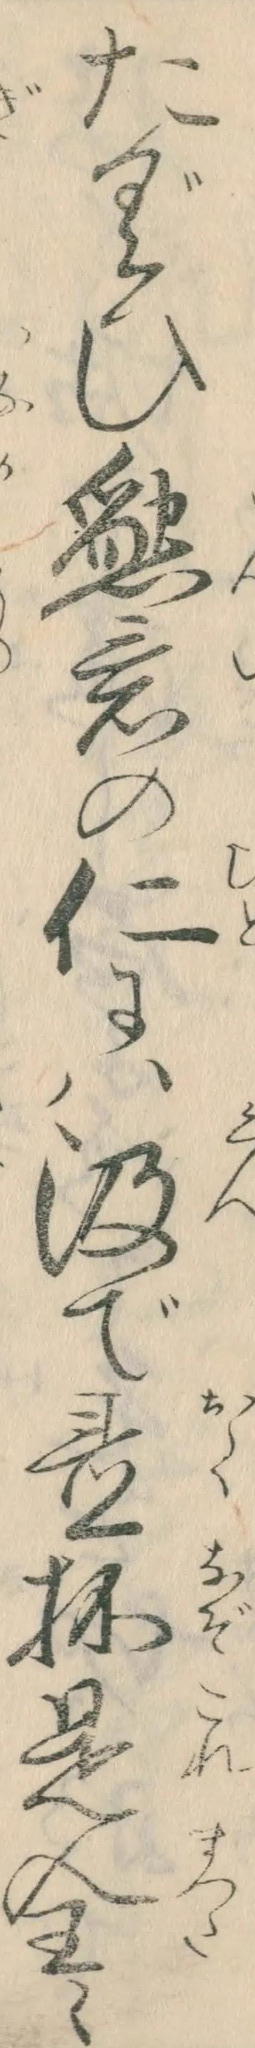たぐひ懇意の仁には汲で置抔是全く
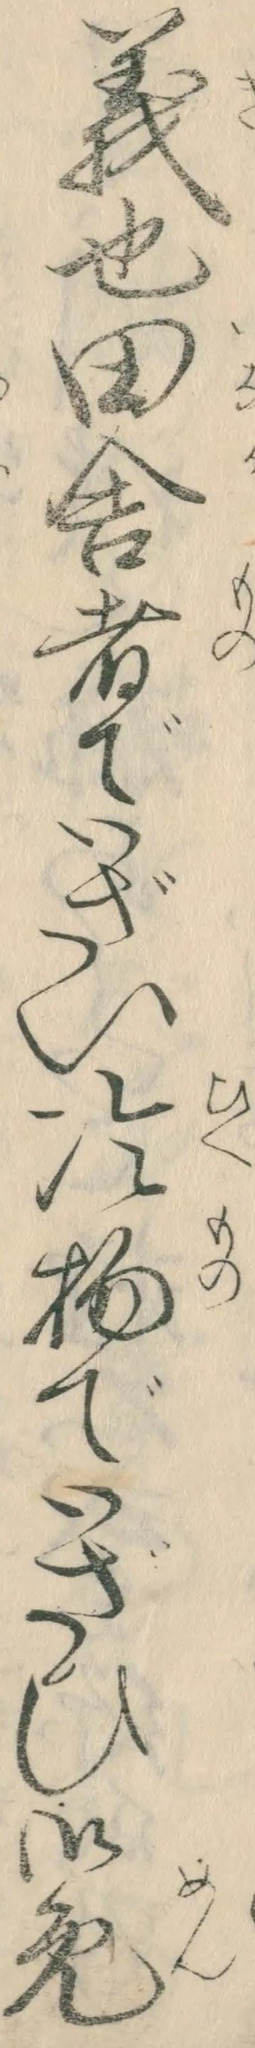義也田舎者で御ざい冷物で御ざひ御免
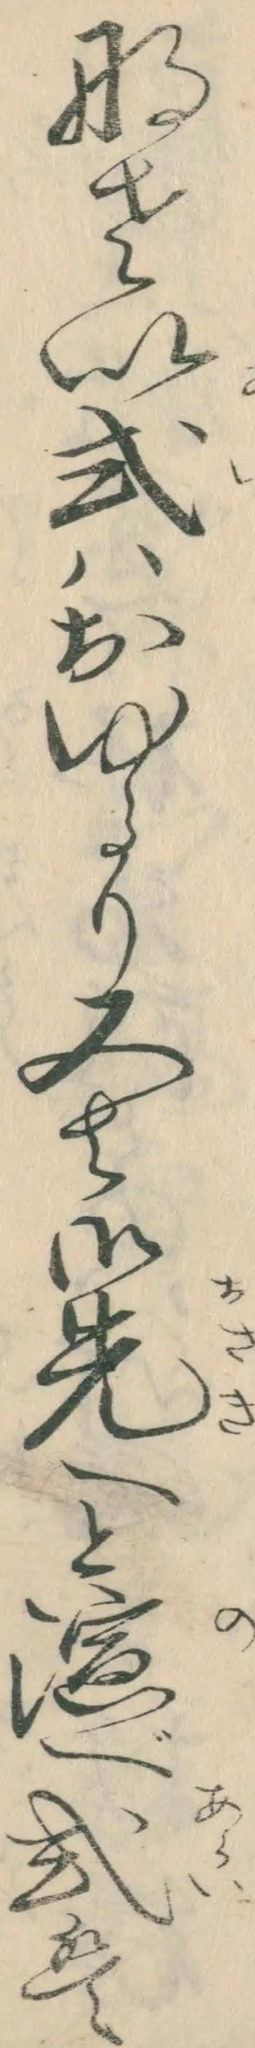なさい或はおゆより又は御先へと演べ或は

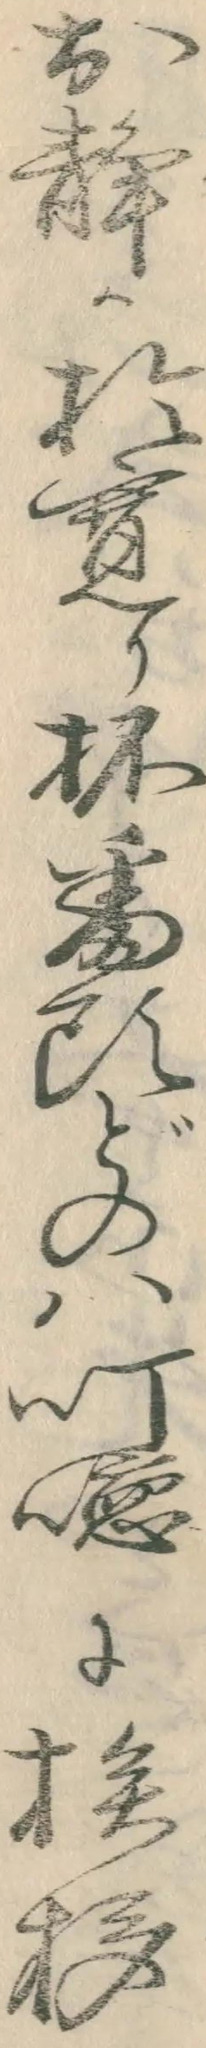お静か於寛り抔番頭どのは叮嚀に挨拶
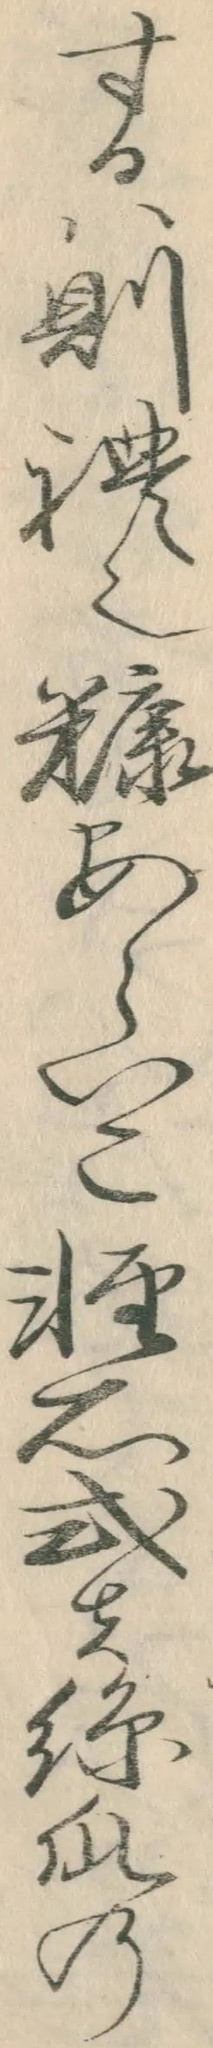するは則礼也糠あらいこ軽石或は糸瓜の
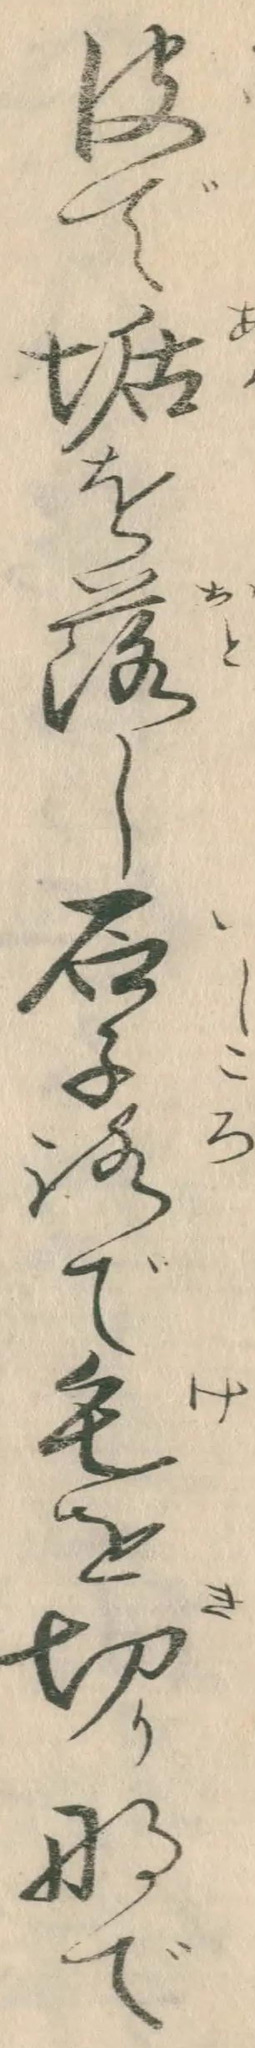皮で垢を落し石子路で毛を切りなで
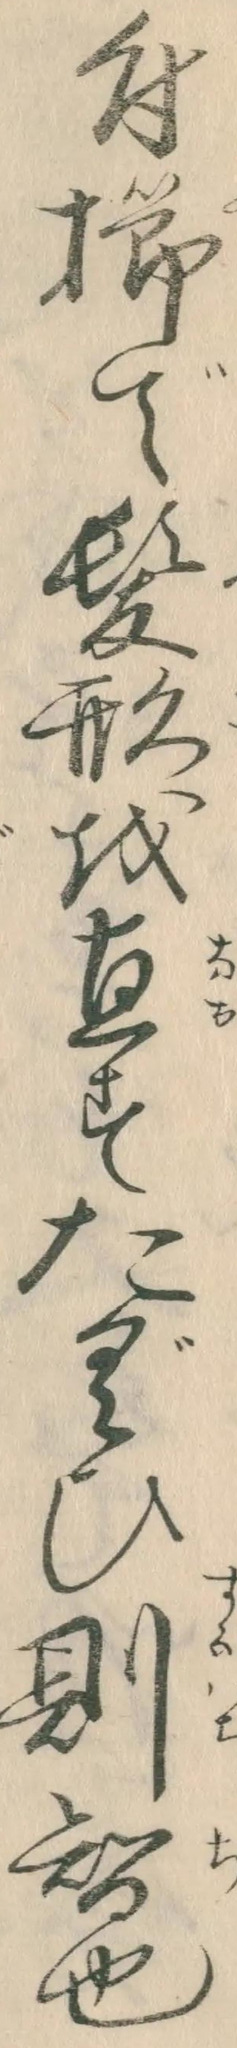付櫛で髪形を直すたぐい則智也
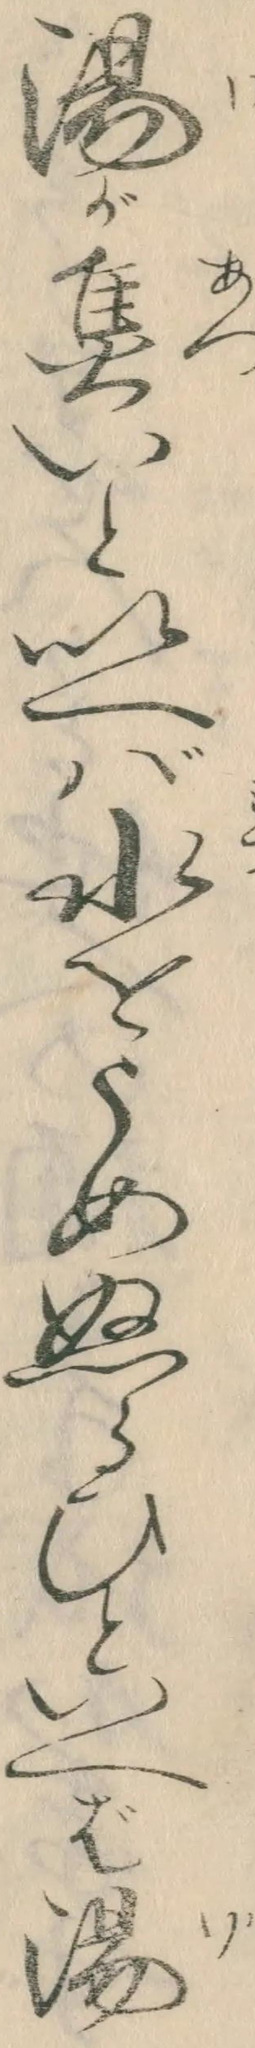湯が焦いといへば水をうめぬるひといへば湯
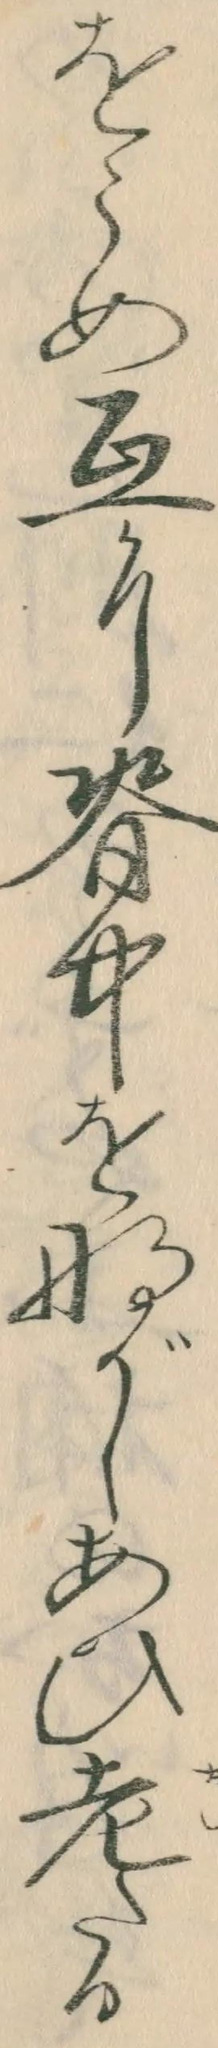をうめ互に脊中をながしあひ老たる
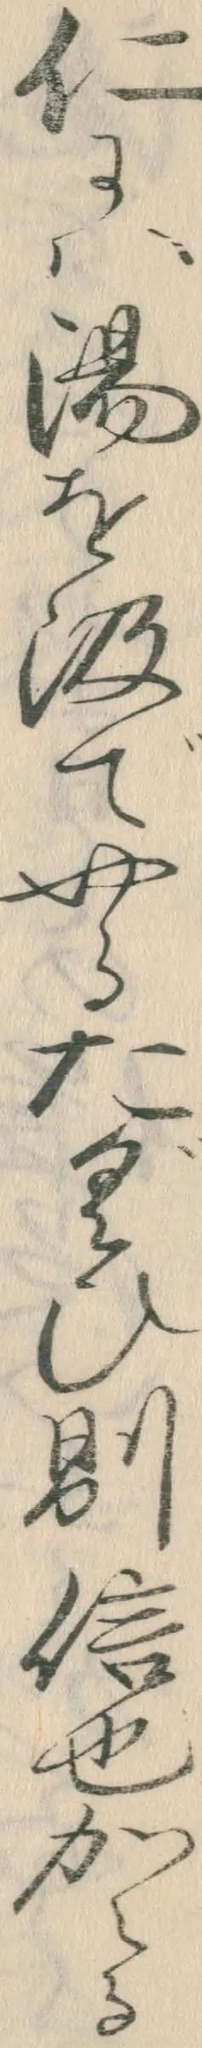仁には湯を汲でやるたぐひ則信也かゝる
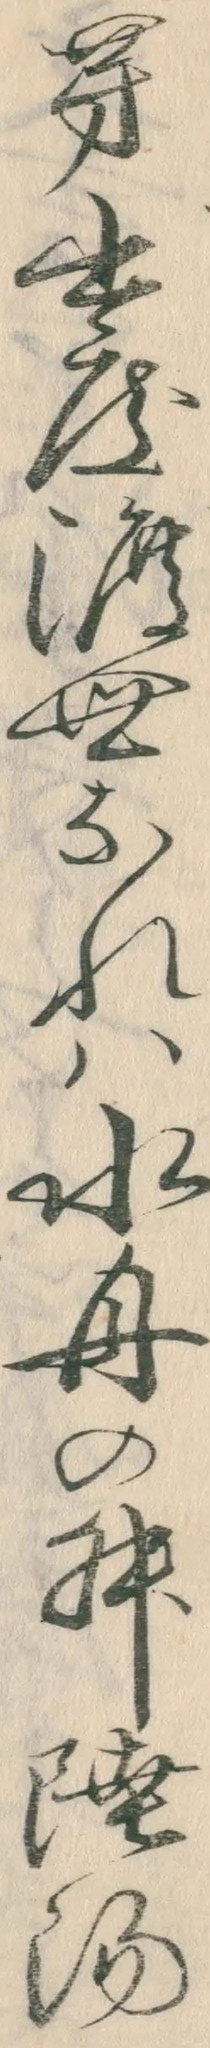芽出度渡世なれは水舟の升陸湯
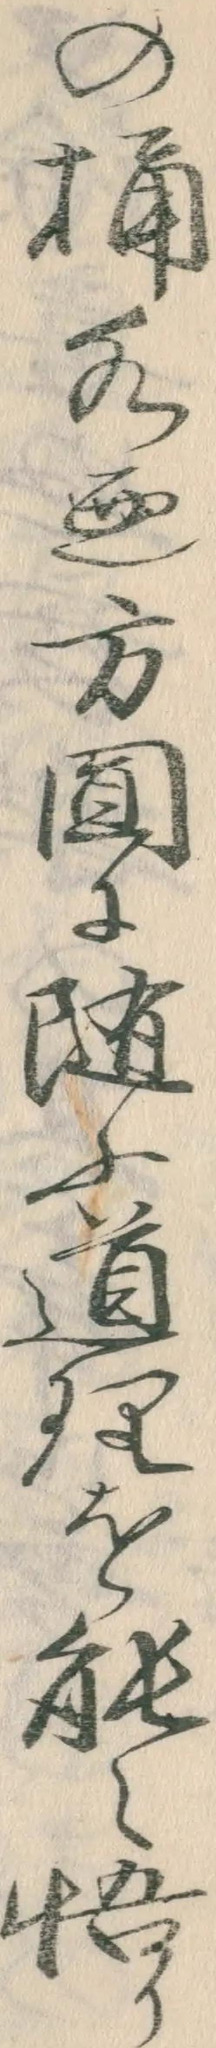の桶水迺方円に随ふ道理を能々悟り
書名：洗湯手引草
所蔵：国立国会図書館 National Diet Library, JAPAN
